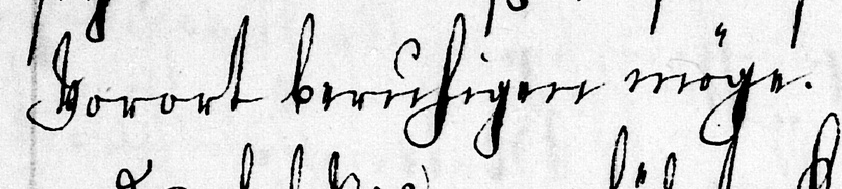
Vorort beruhigen möge.
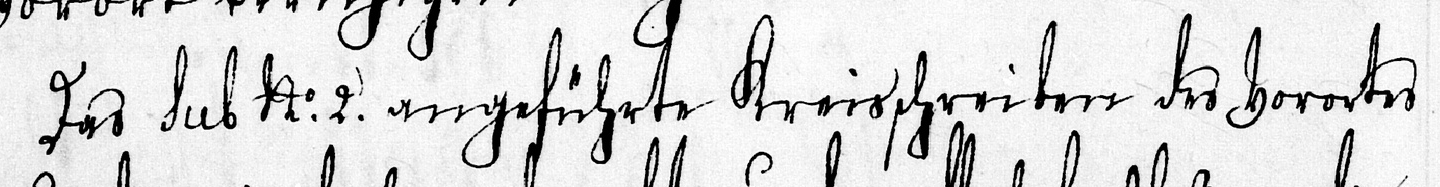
Das Sub No. 2. angeführte Kreisschreiben des Vorortes
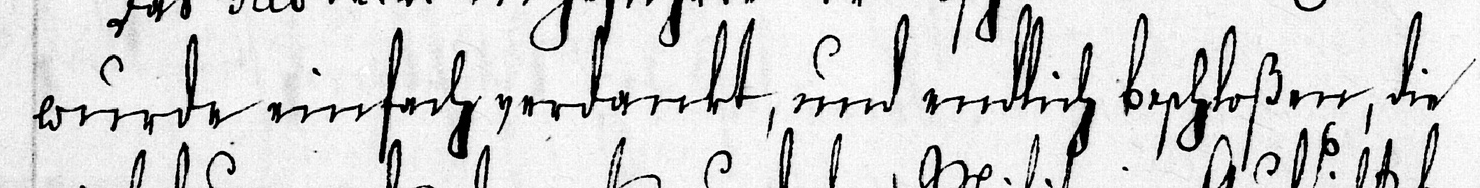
wurde einfach verdankt, und endlich beschloßen, die
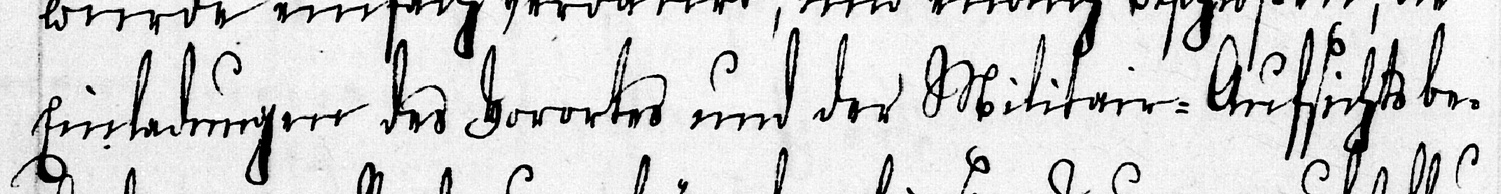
Einladungen des Vorortes und der Militair-Aufsichtsb¬
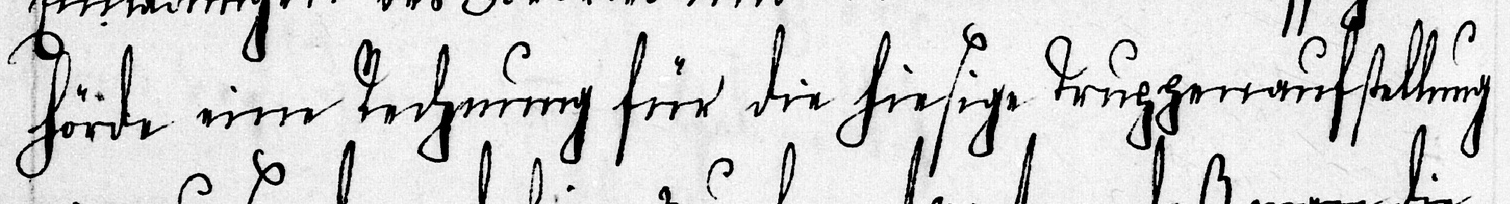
ehörde eine Rechnung für die hiesige Truppenaufstell¬
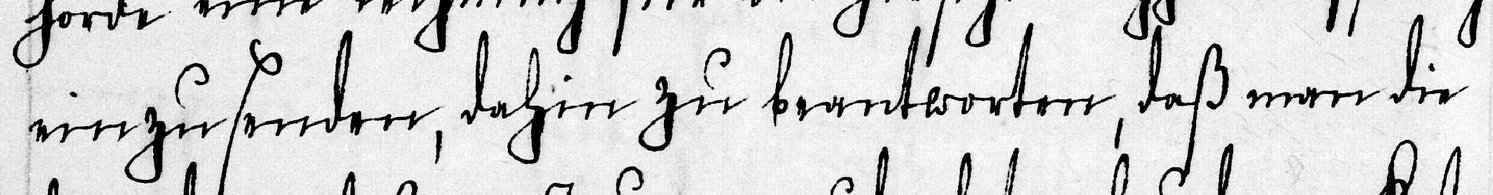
einzusenden, dahin zu beantworten, daß man die
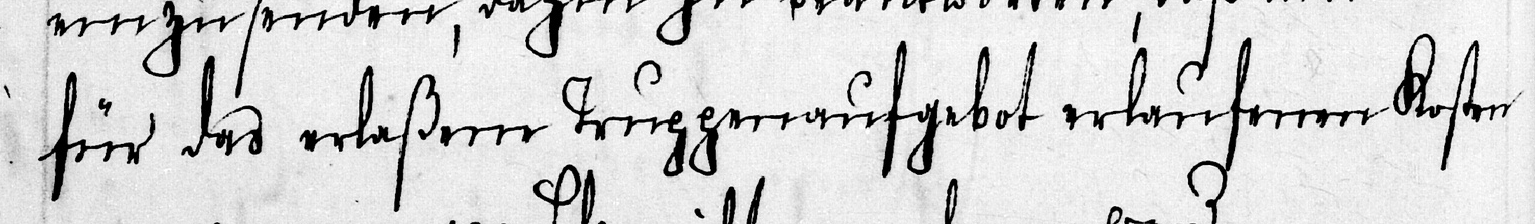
für das erlaßene Truppenaufgebot erlaufenen Kosten
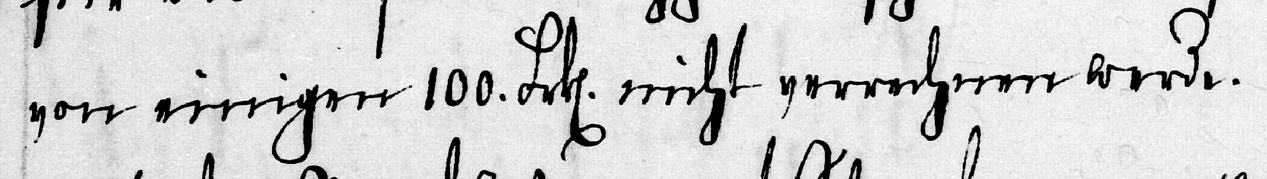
von einigen 100. Frk[en]. nicht verrechnen werde.
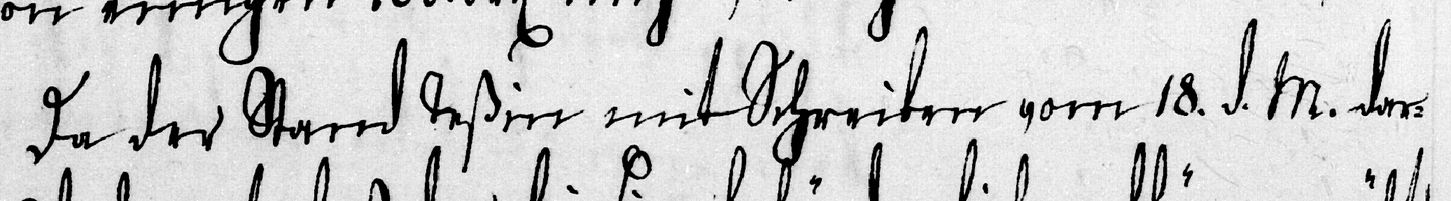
Da der Stand Teßin mit Schreiben vom 18. d. M. da¬
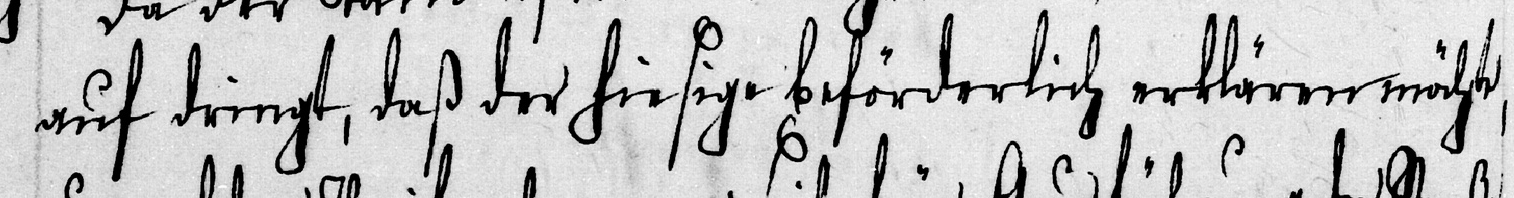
rauf dringt, daß der hiesige beförderlich erklären möch¬
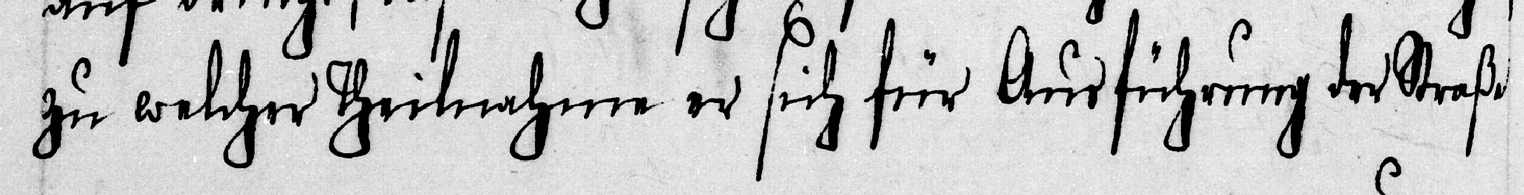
zu welcher Theilnahme er sich für Ausführung der Straße
